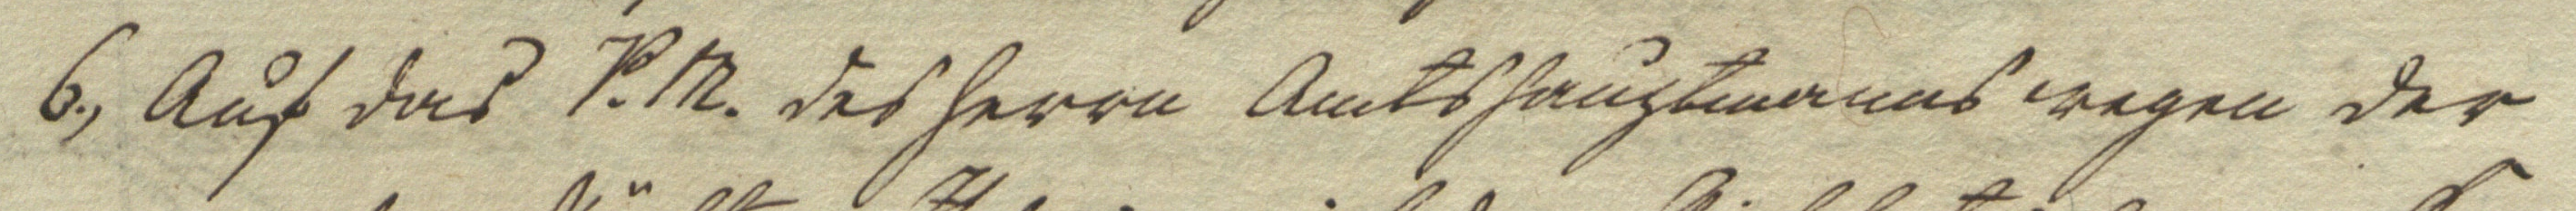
6., Auf des P. M. des Herrn Amtshauptmanns wegen der
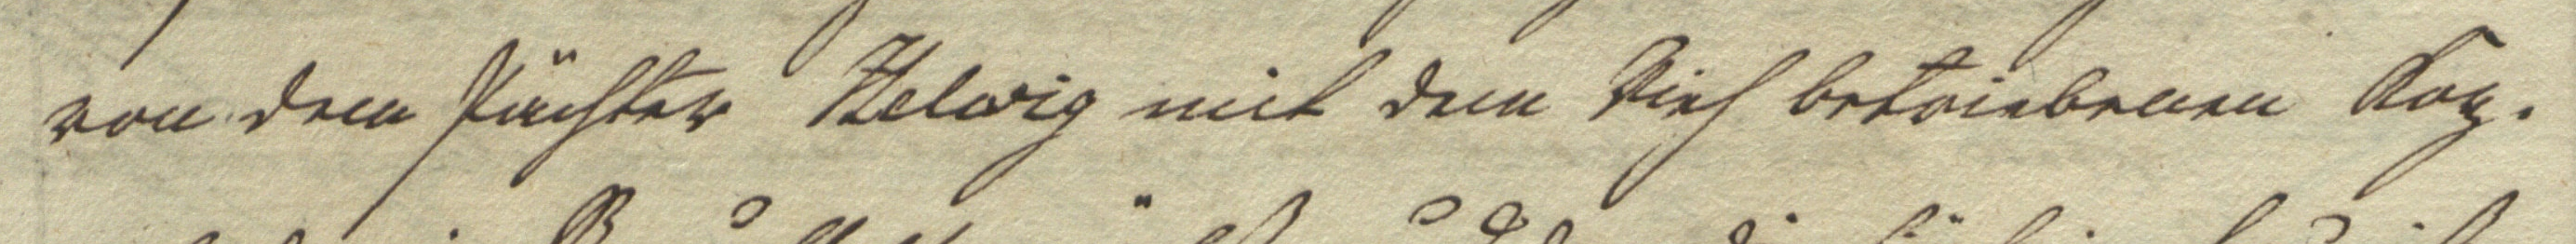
von dem Pächter Helwig mit dem Vieh betriebenen Kop¬
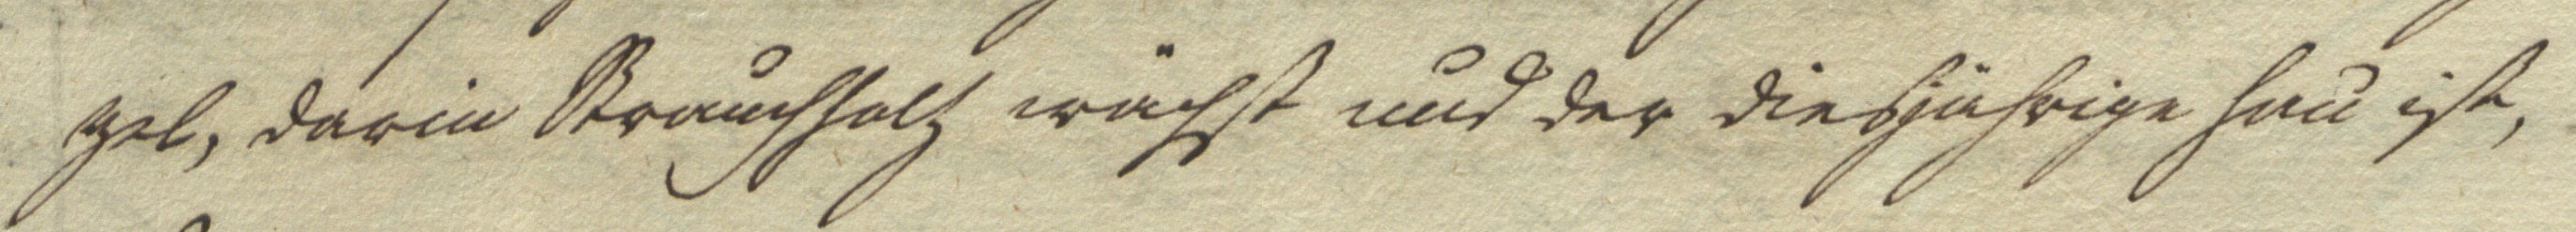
pel, darin Brauchholz wächst und der diesjährige Hau ist,
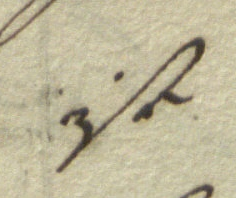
ist
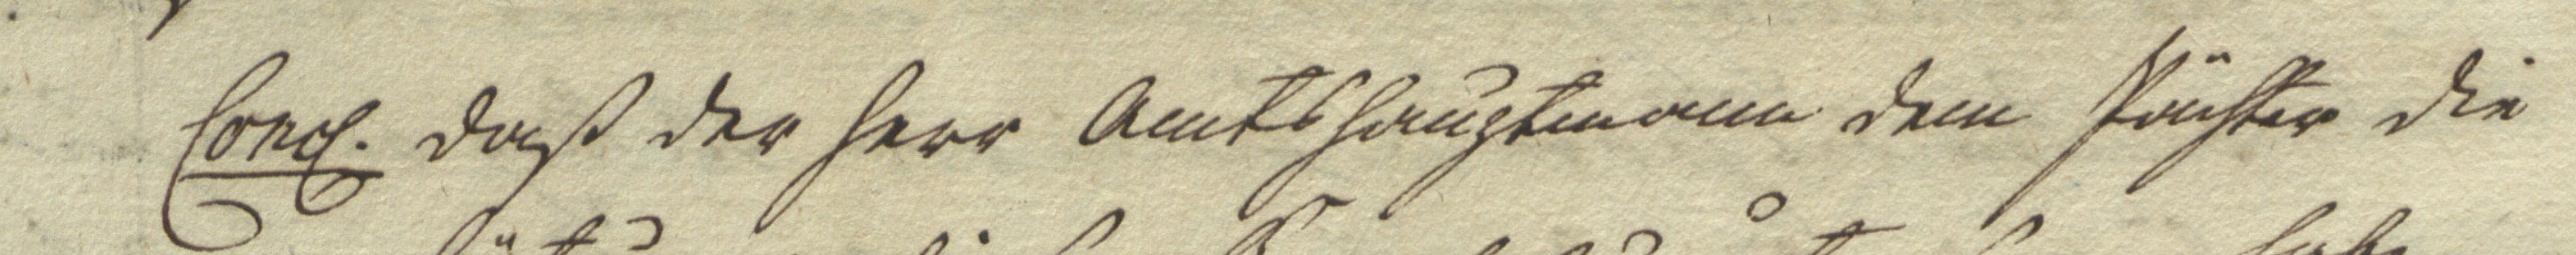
Concl. daß der Herr Amtshauptmann dem Pächter die
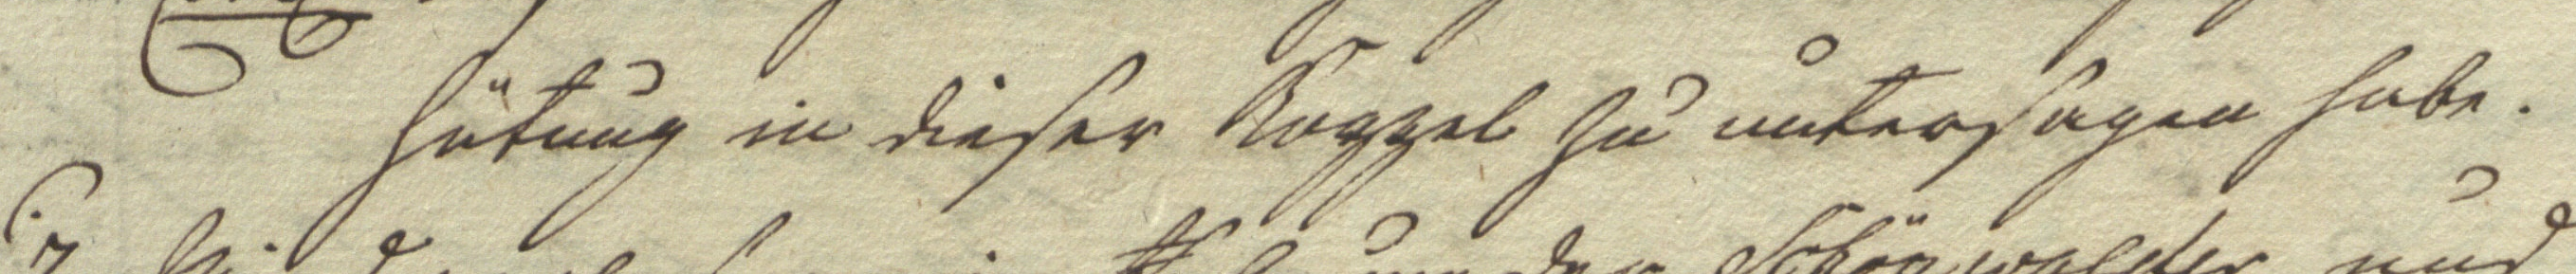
Hütung in dieser Koppel zu untersagen habe.
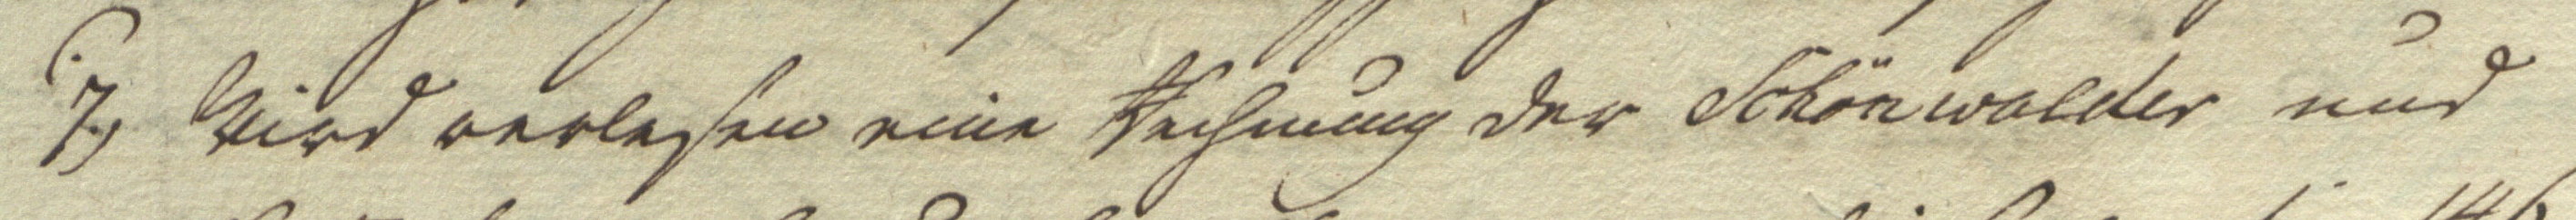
7., Wird verlesen eine Rechnung der Schönwalder und
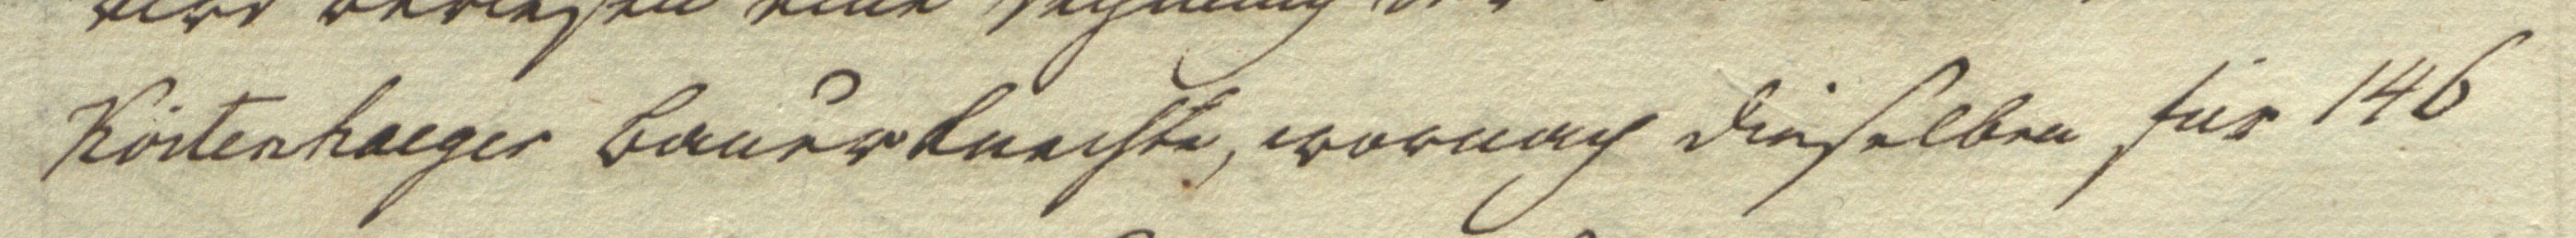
Koitenhaeger Bauerknechte, wornach dieselben für 146
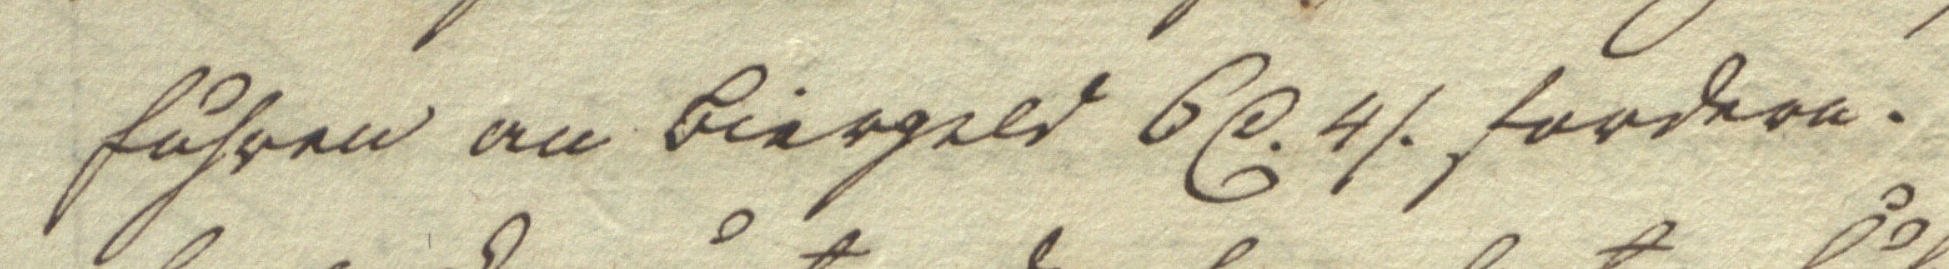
Fuhren an Biergeld 6 rtl. 4 s. fordern.
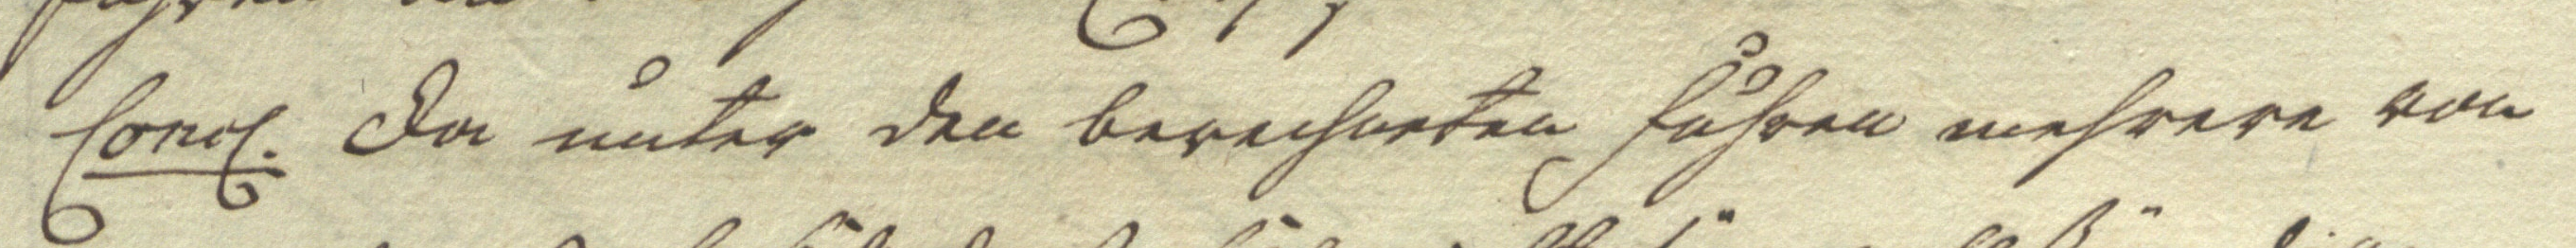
Concl. da unter den berechneten Fuhren mehrere von
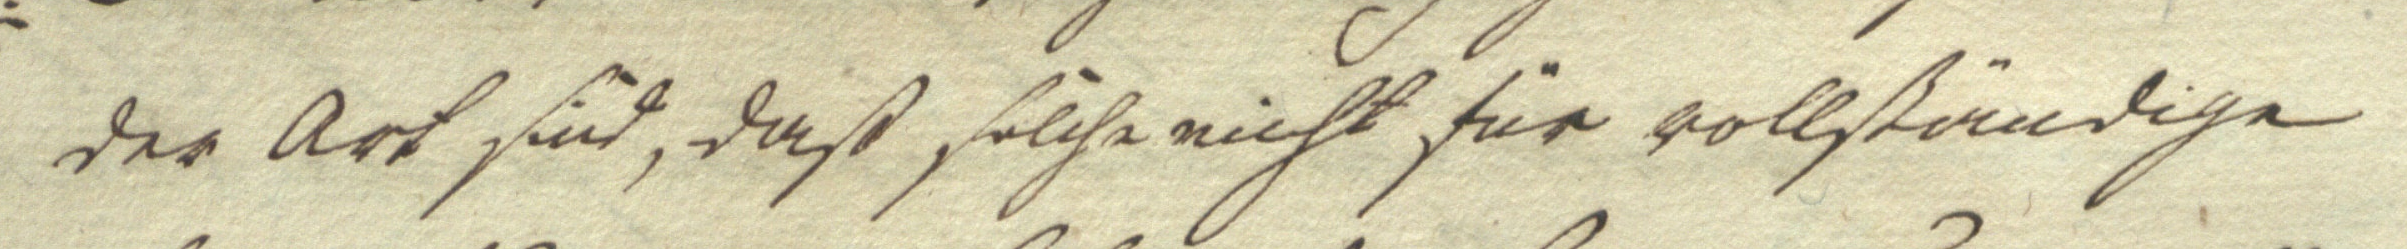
der Art sind, daß solche nicht für vollständige
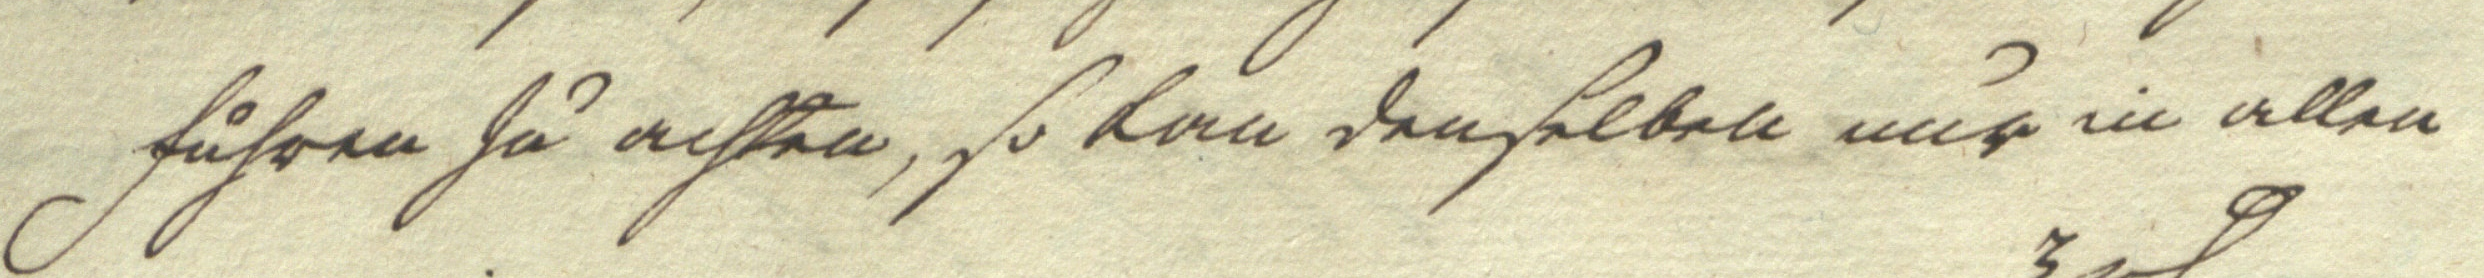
Fuhren zu achten, so kan denselben nur in allen
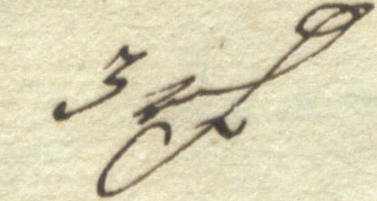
3 rtl.
